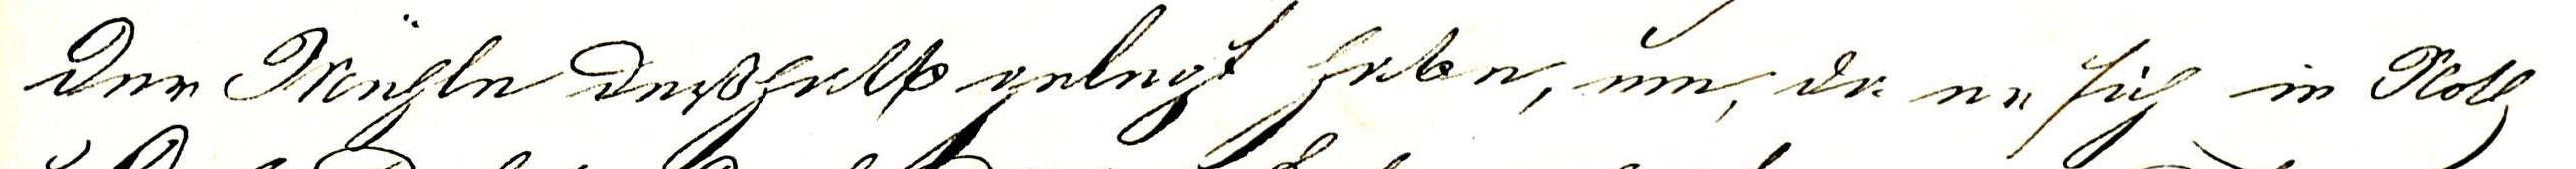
der Mühle deßhalb gelegt habe, um, da er sich in Noth
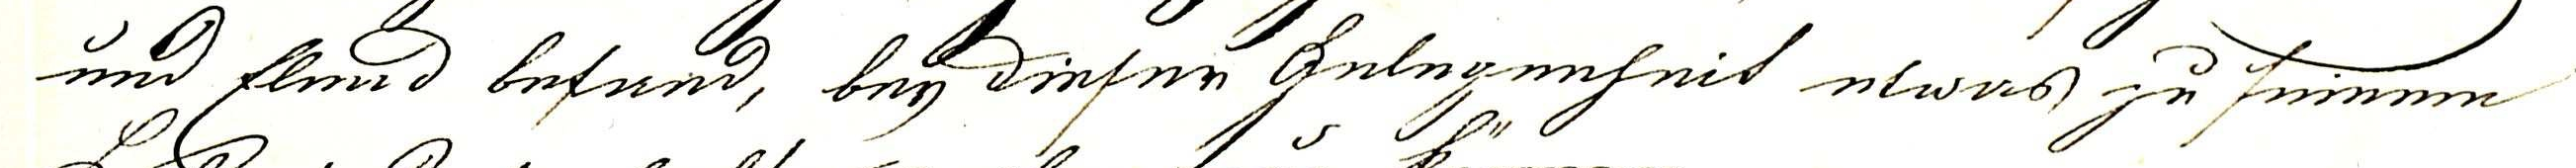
und Elend befand, bey dieser Gelegenheit etwas zu seinem
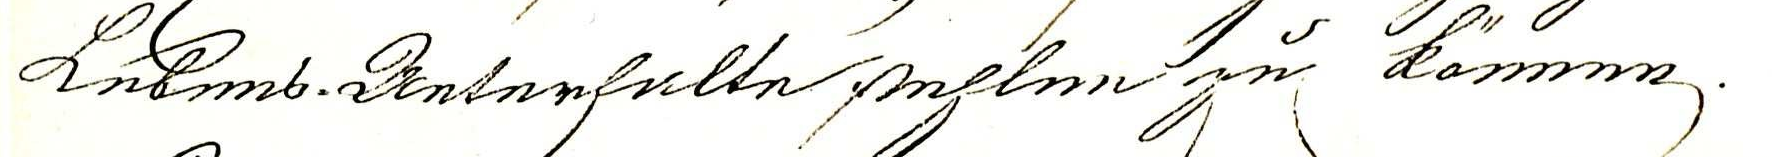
Lebens-Unterhalte stehlen zu können.
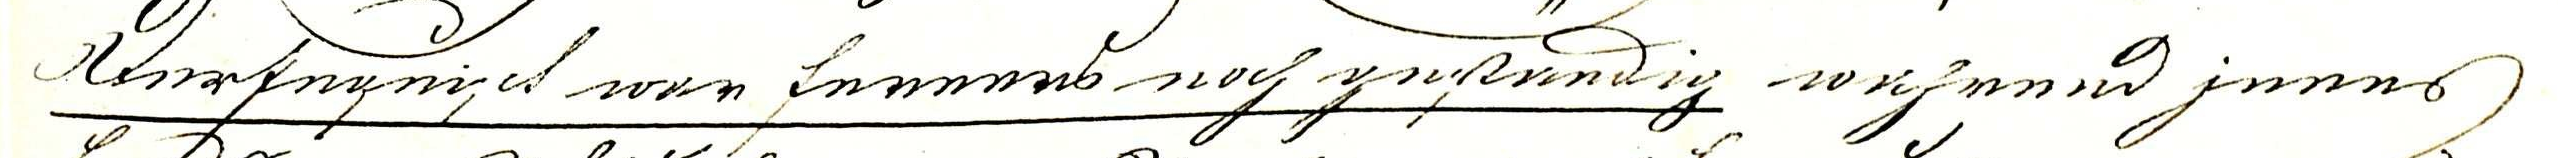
Der Inquisit war ferners noch geständig während jenes
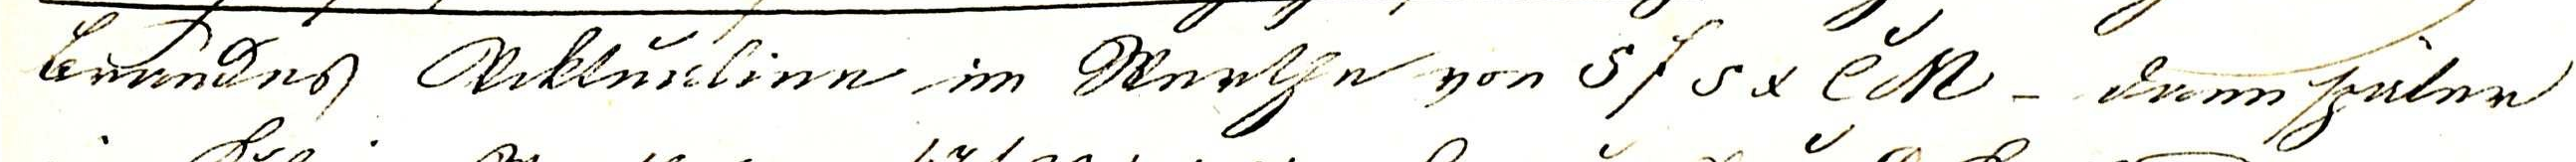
Brandes Viktualien im Werthe von 5f 5x ČM – dann später
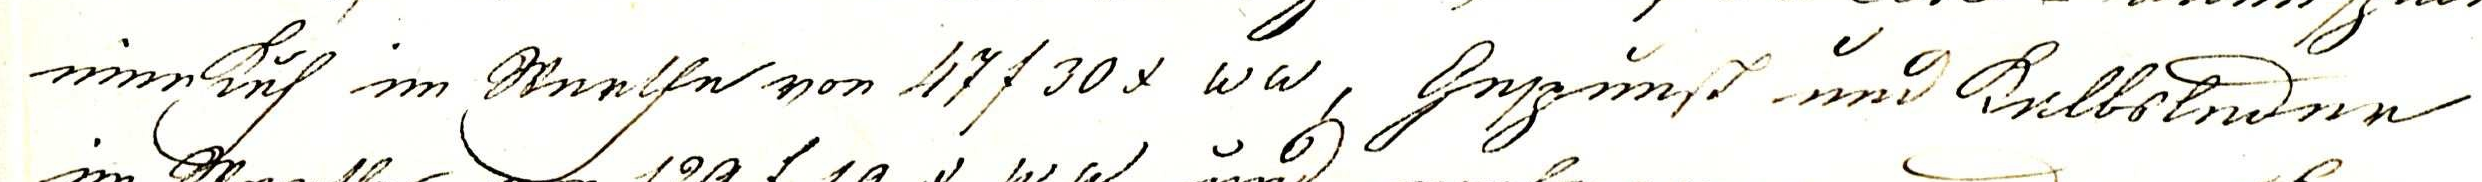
eine Kuh im Werthe von 47 f 30 x WW, Gespunst und Kalbsleder
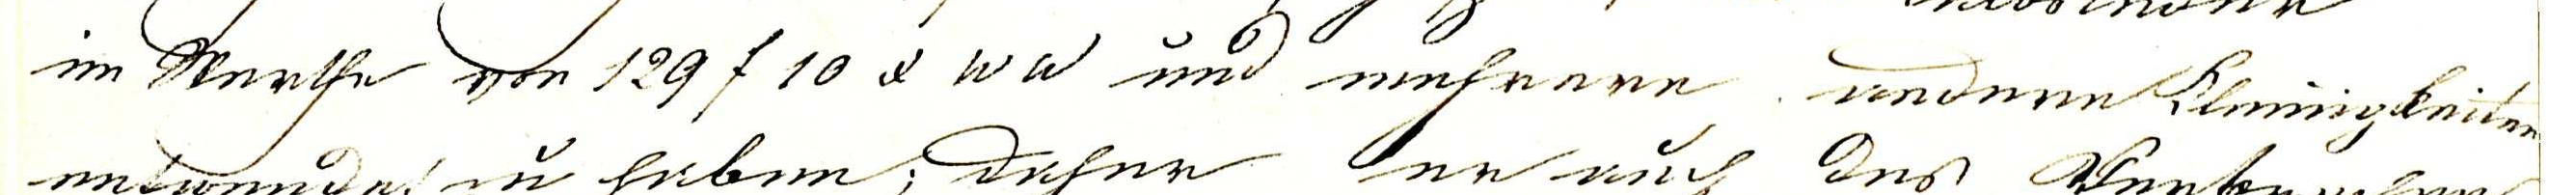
im Werthe von 129f 10x WW und mehrere andere Kleinigkeiten
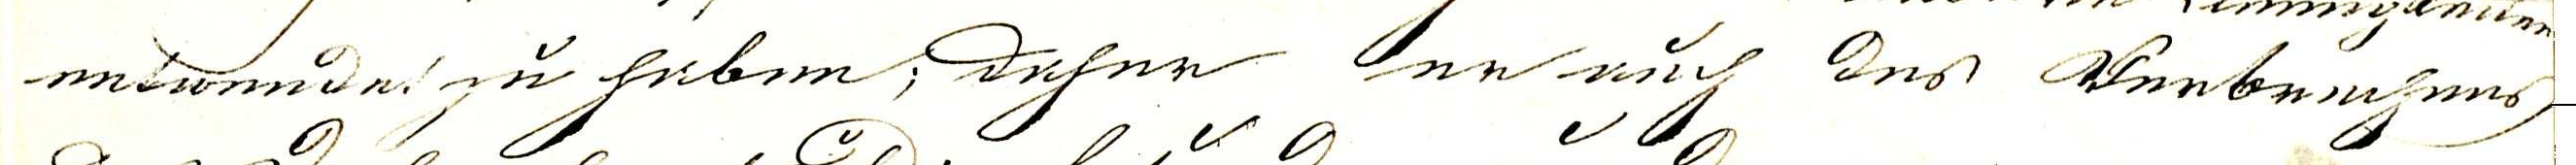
entweder zu haben; daher er auch des Verbrechens
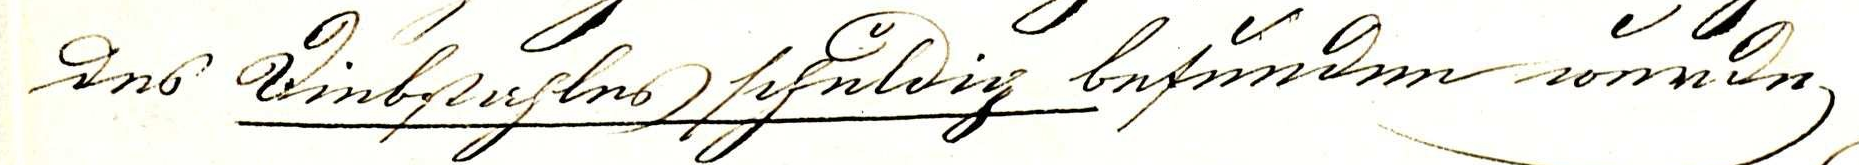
des Diebstahles schuldig befunden wurde.
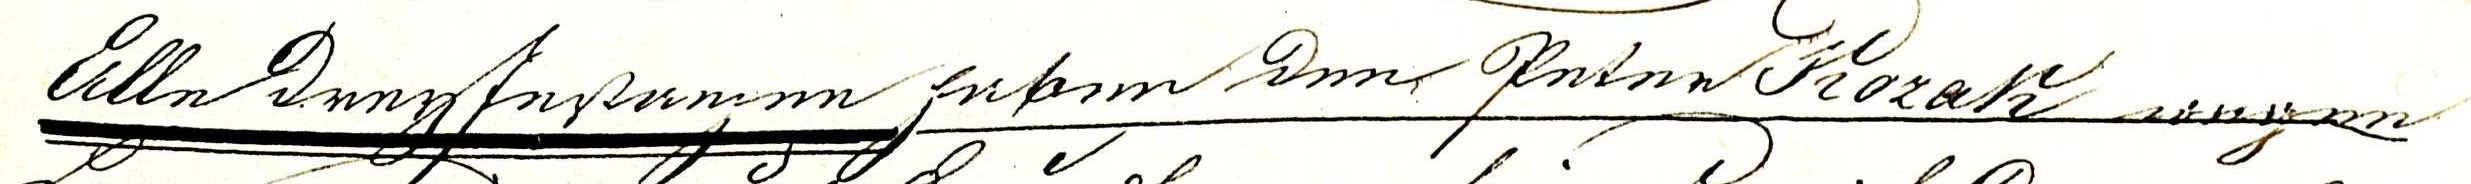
Alle drey Instanzen haben den Peter Kozak wegen
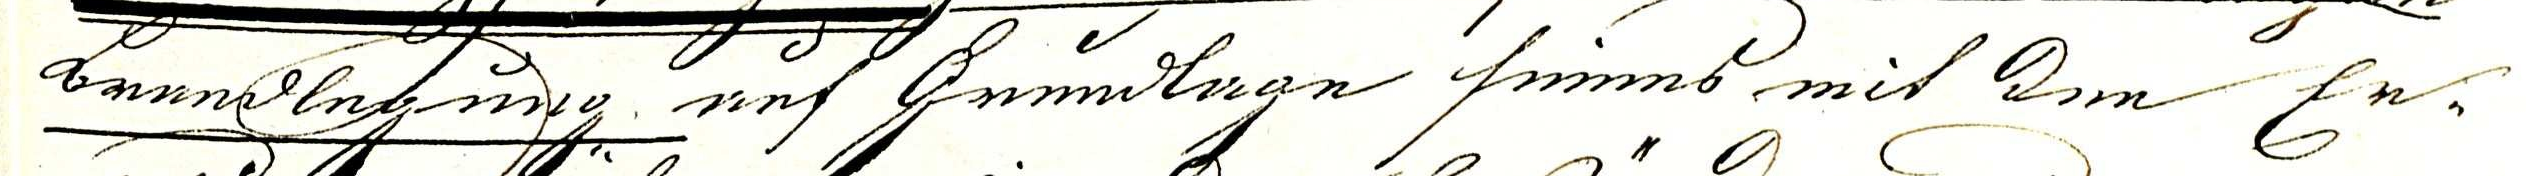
Brandlegung auf Grundlage seines mit dem Er¬
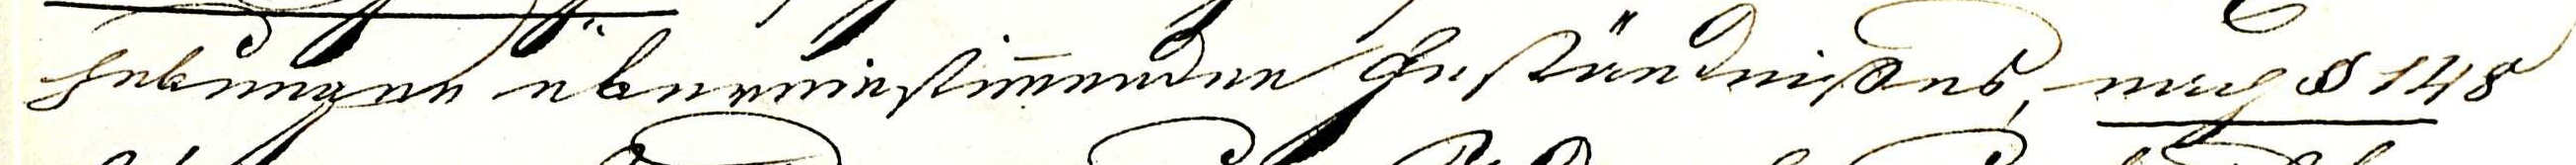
hebungen übereinstimmenden Geständnißes, nach §§148
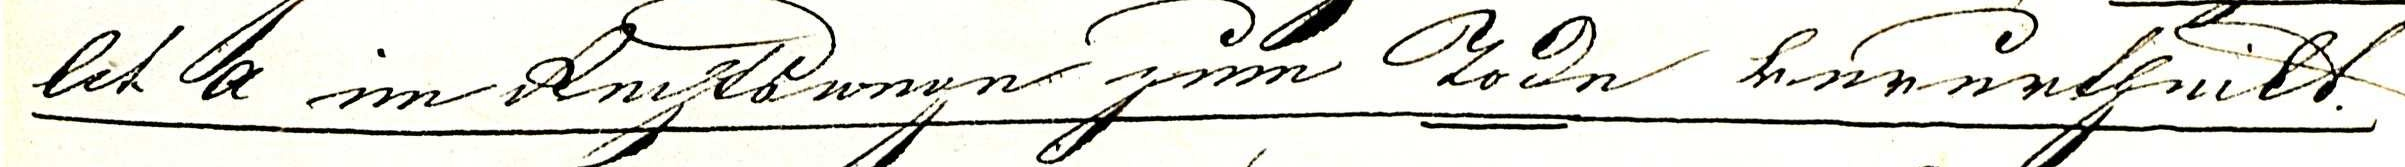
lit A im Rechtsweg zum Tode verurtheilt.
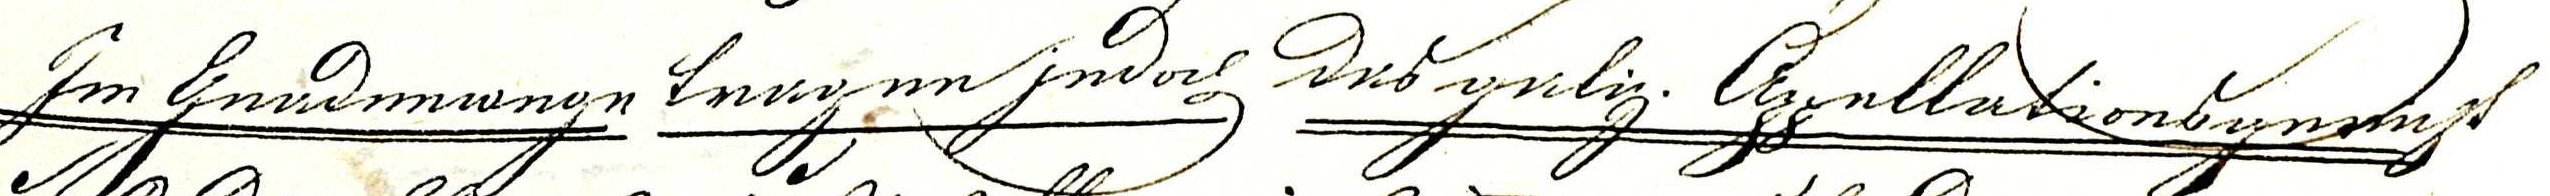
Im Gnadenwege tragen jedoch das galiz. Appellationsgericht
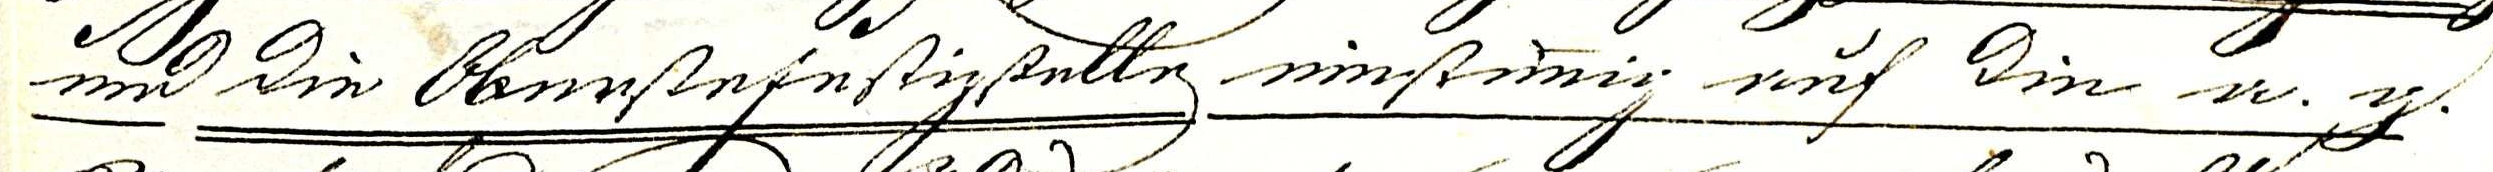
und die Oberste Justizstelle einstimmig auf die a.g.
